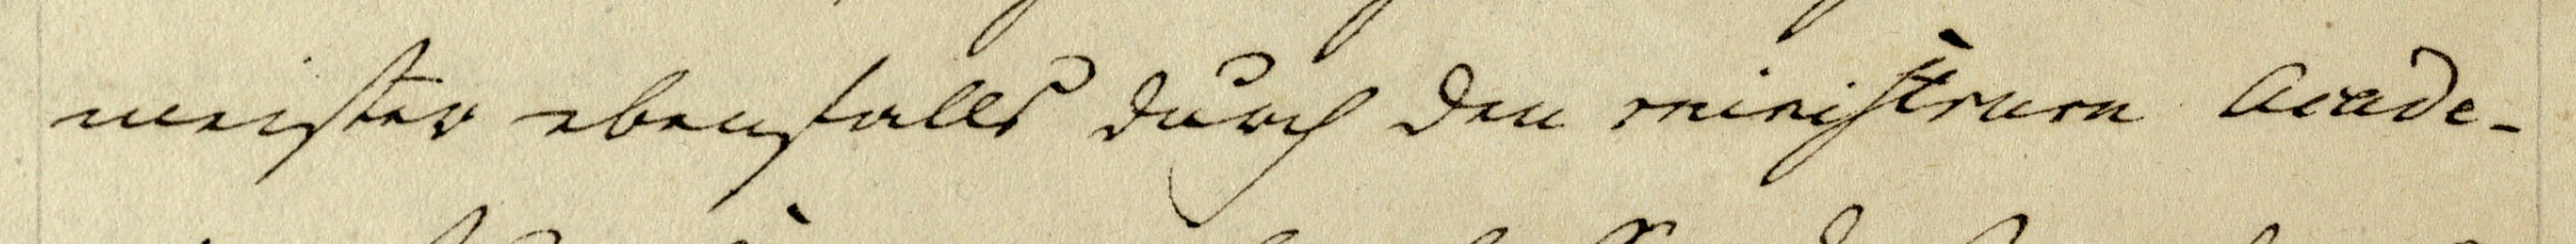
meister ebenfalls durch den ministrum Acade¬
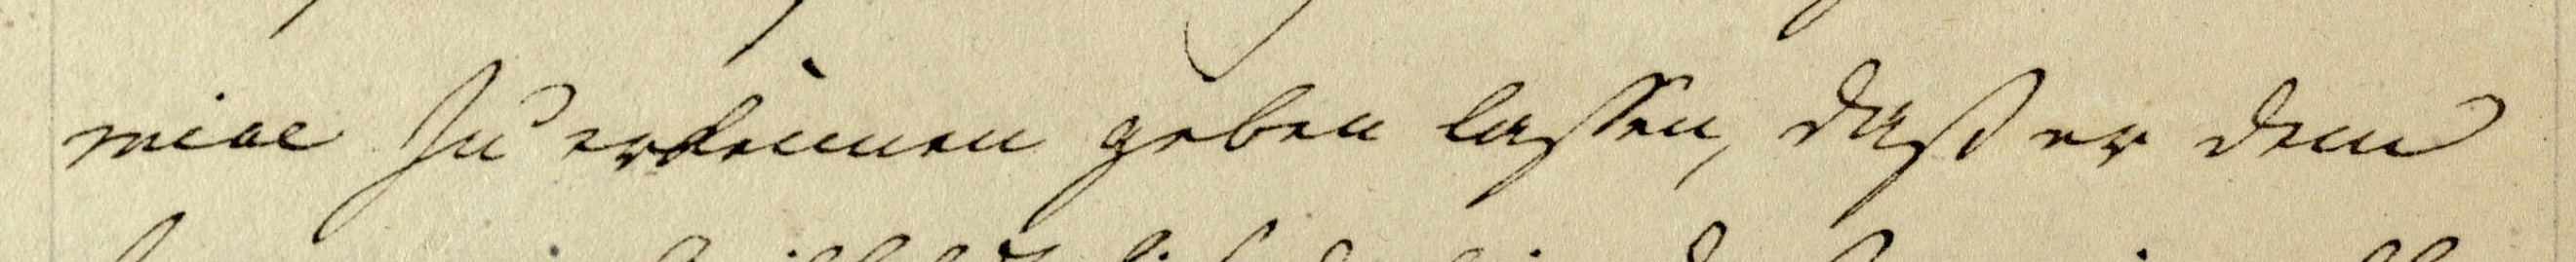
miae zu erkennen geben lassen, daß er dem
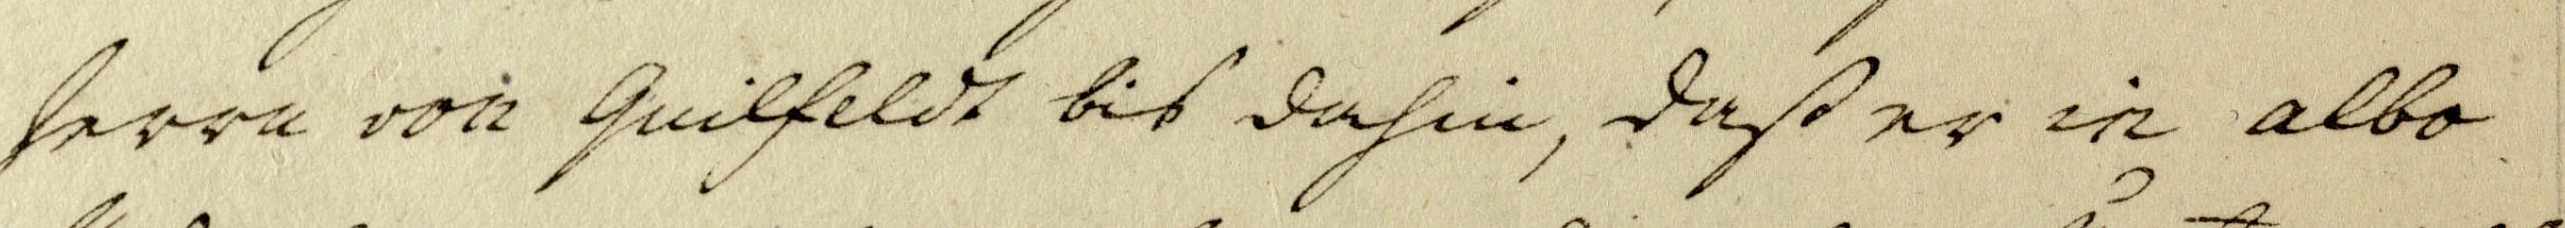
Herrn von Quilfeldt bis dahin, daß er in albo
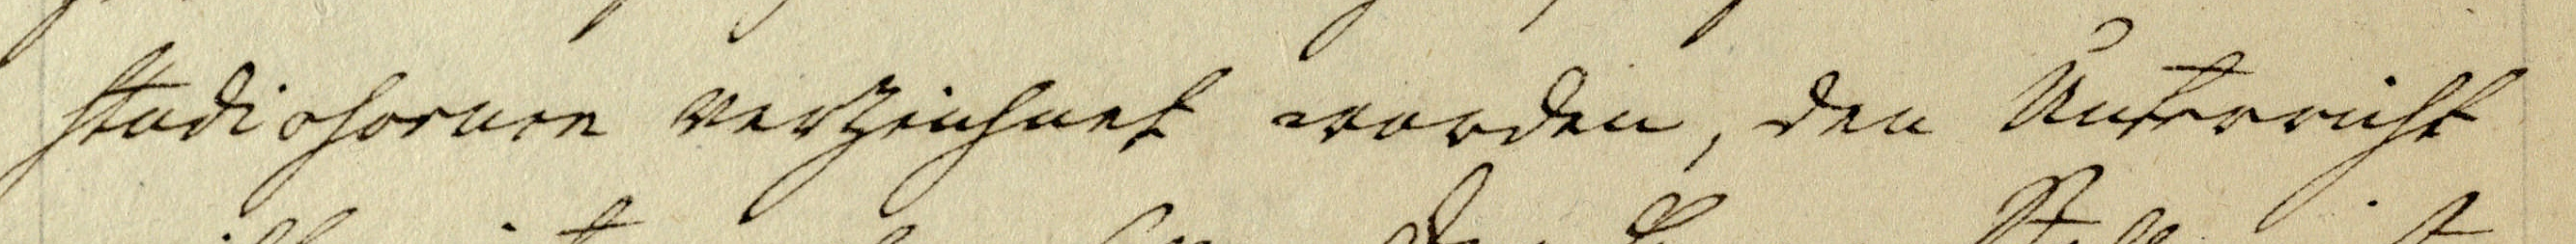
Studiosorum verzeichnet worden, den Unterricht
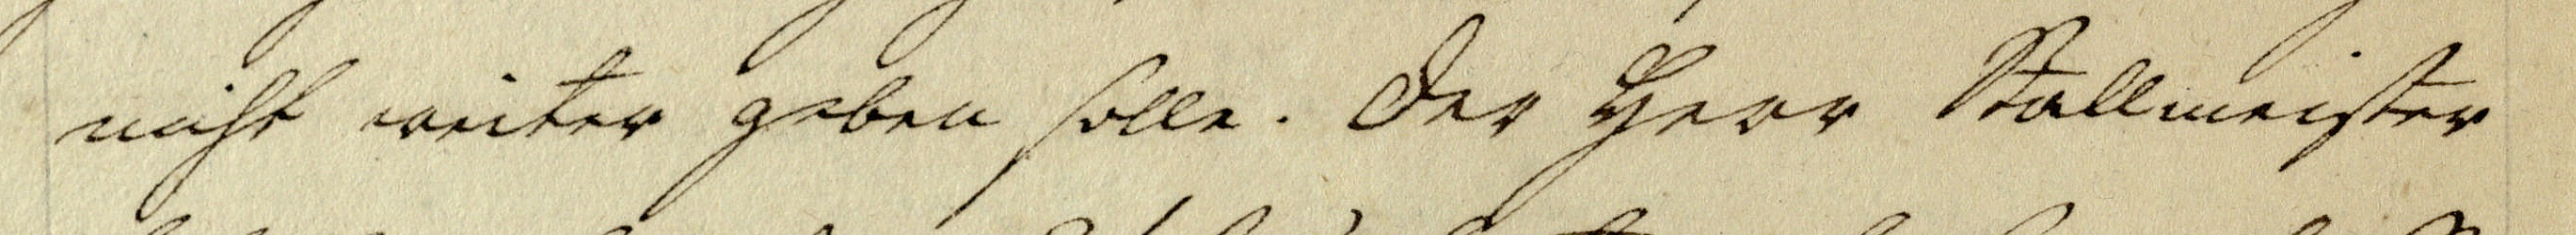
nicht weiter geben solle. Der Herr Stallmeister
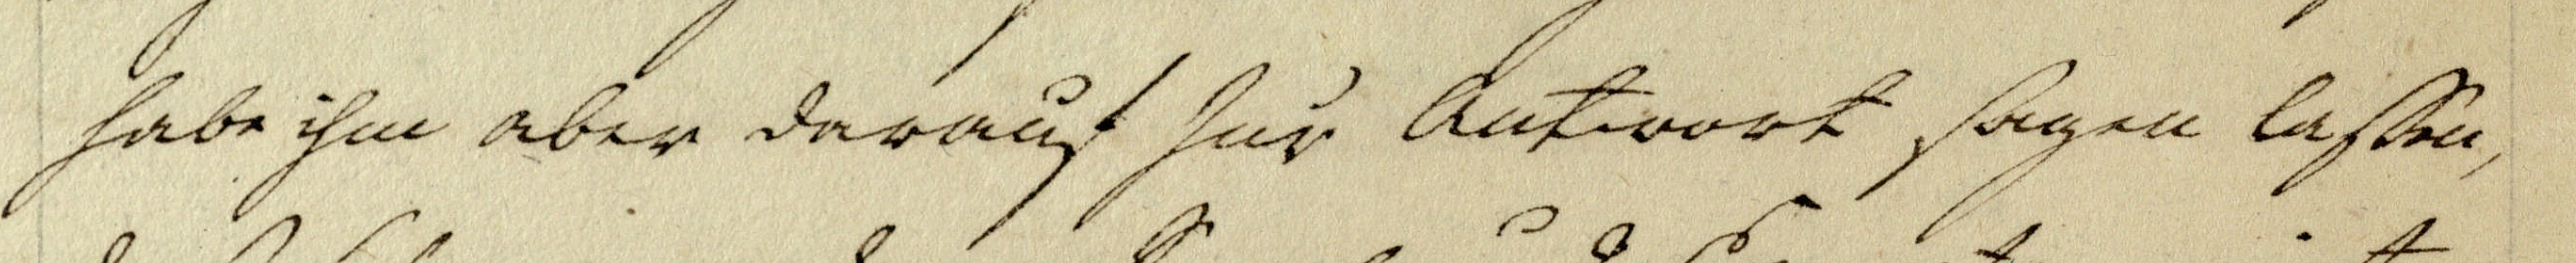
habe ihm aber darauf zur Antwort sagen lassen,
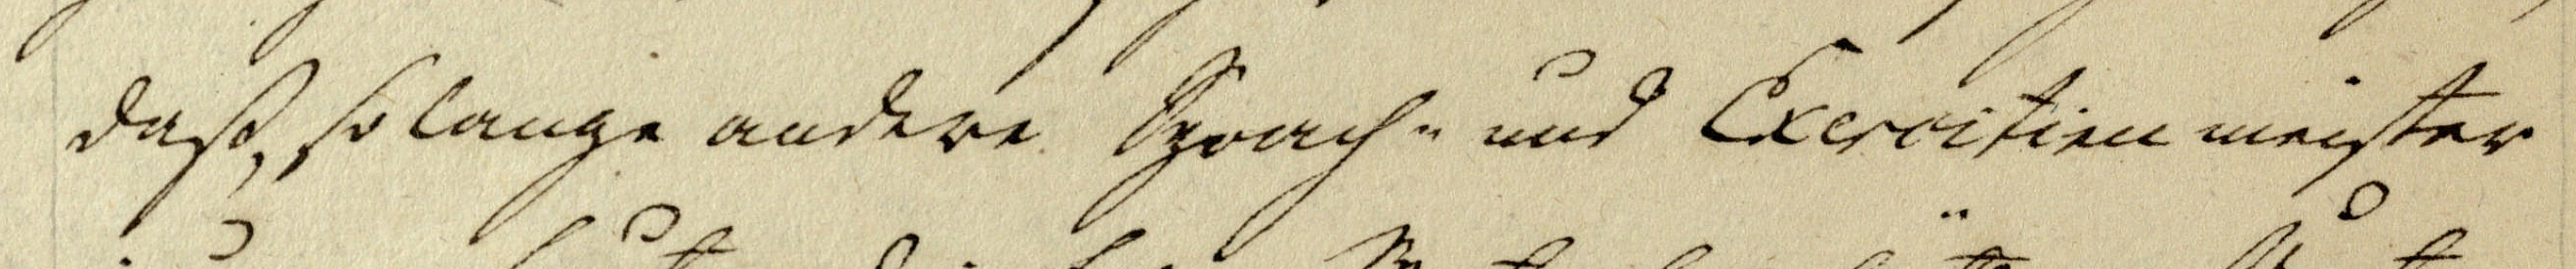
daß, so lange andere Sprach- und Exercitienmeister
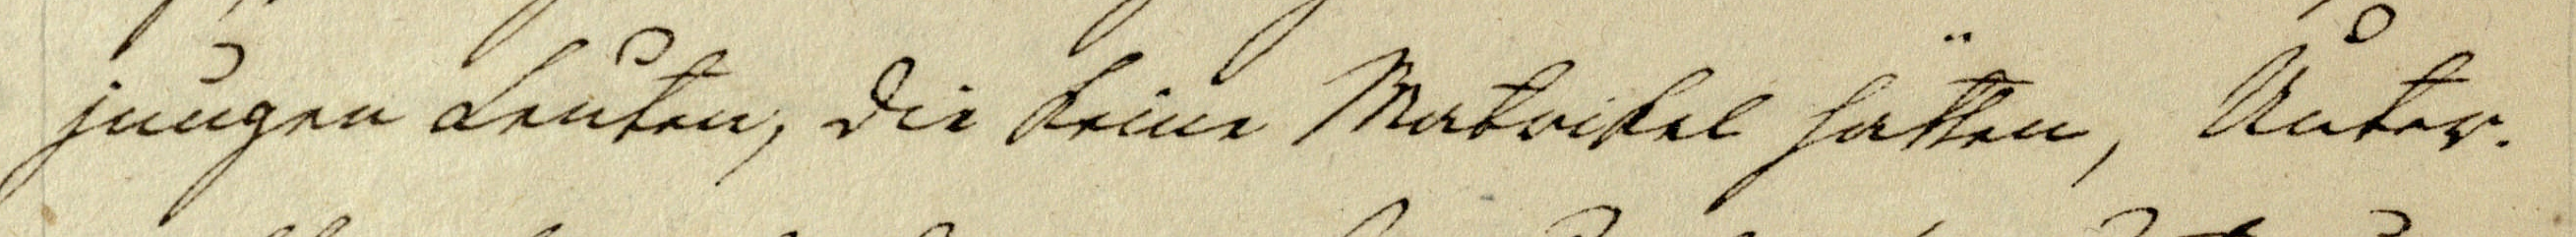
jungen leuten, die keine Matrikel hätten, Unter¬
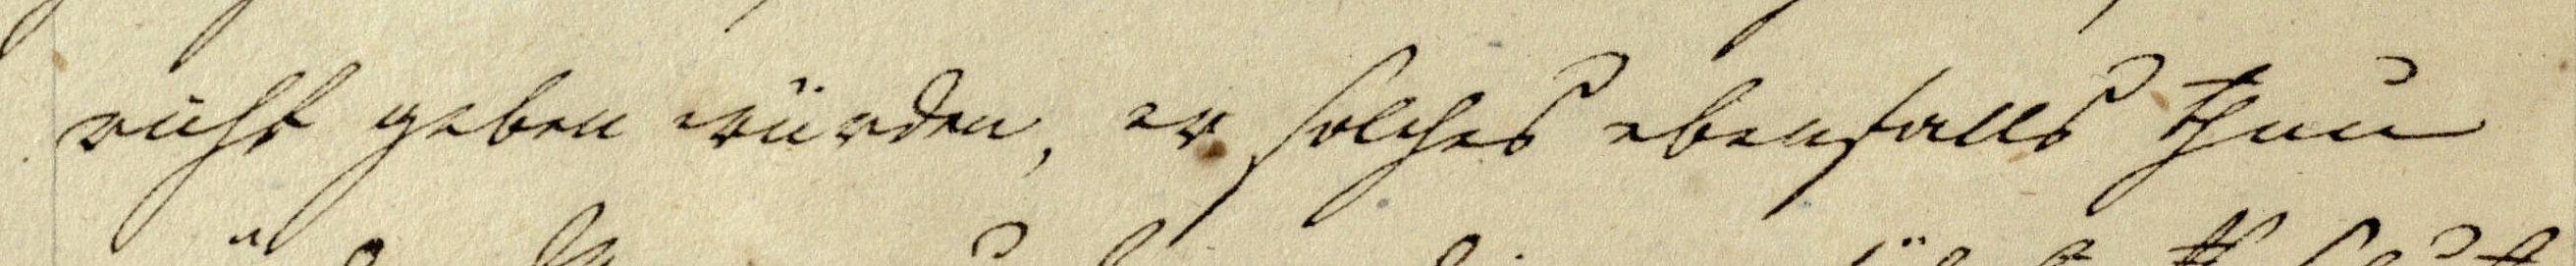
richt geben würden, er solches ebenfalls thun
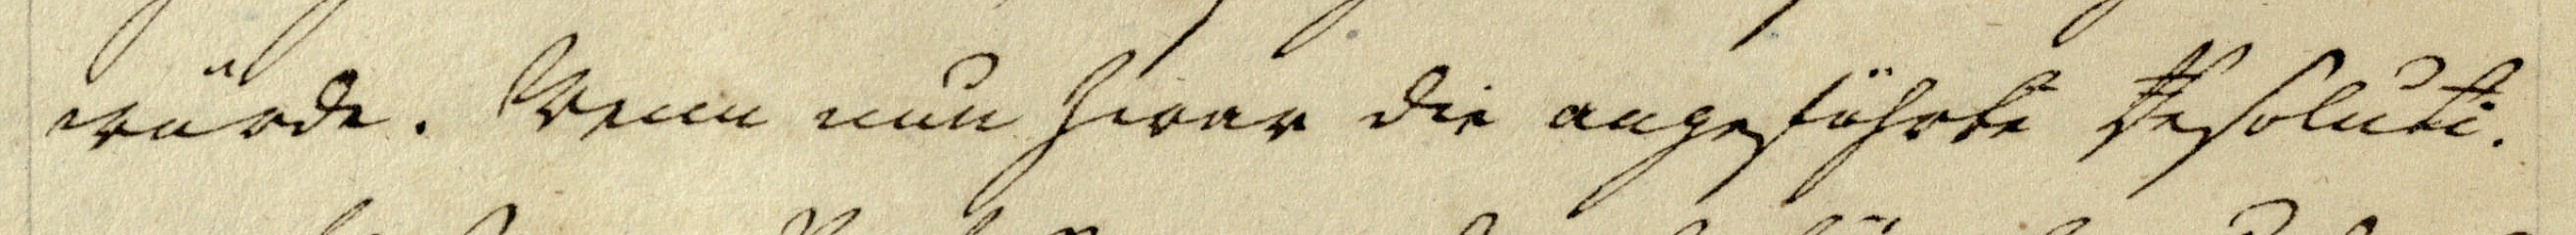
würde. Wenn nun zwar die angeführte Resoluti¬
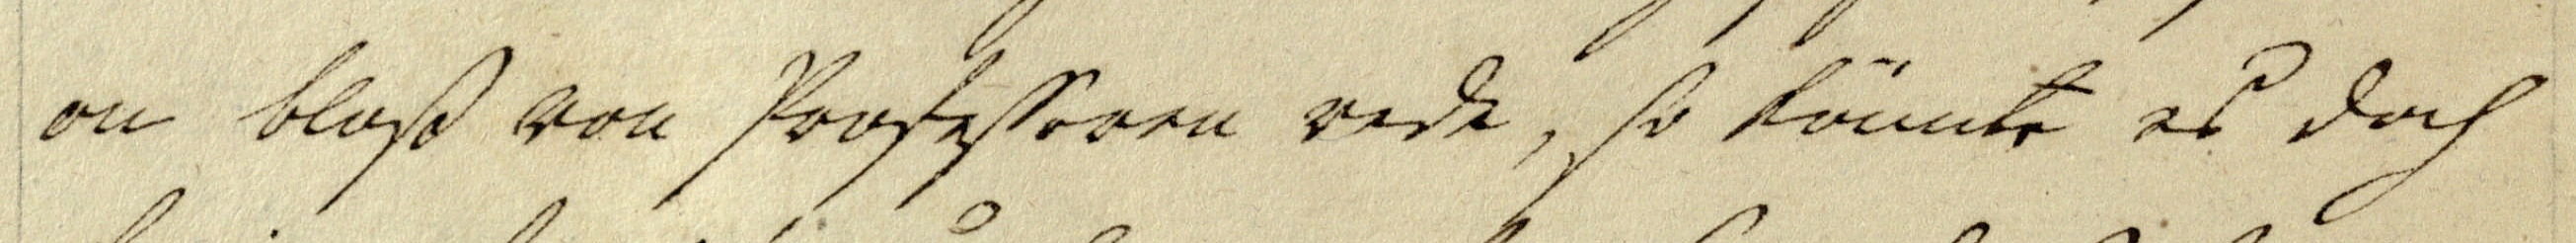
on bloß von Professoren rede, so könnte es doch
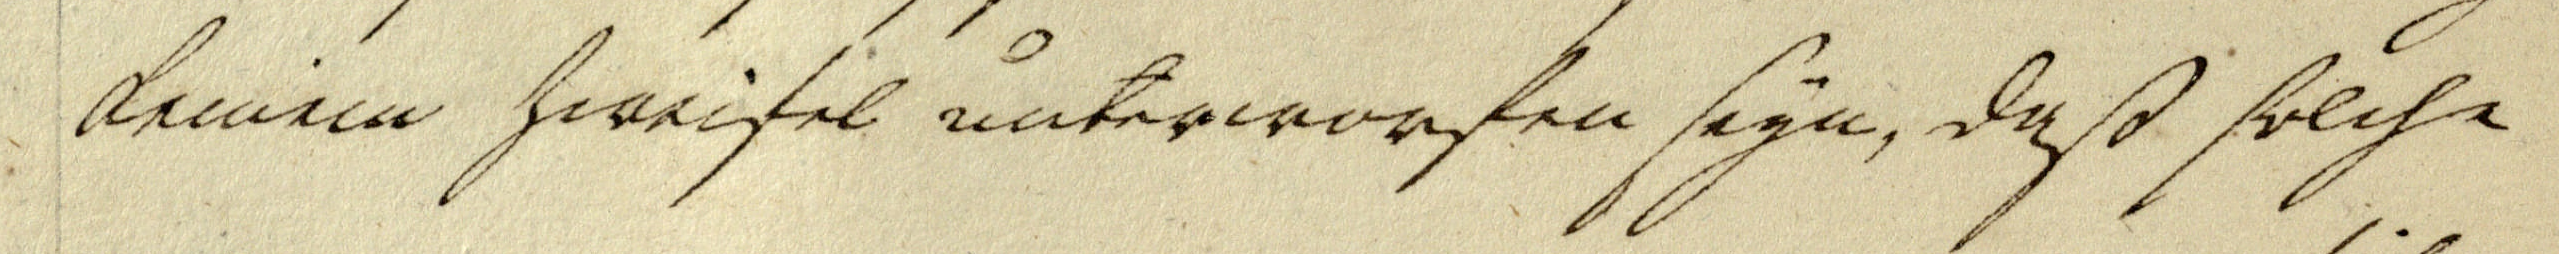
keinem Zweifel unterworfen seÿn, daß solche
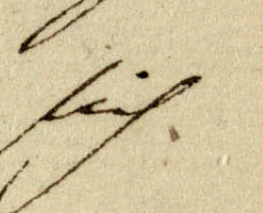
sich
